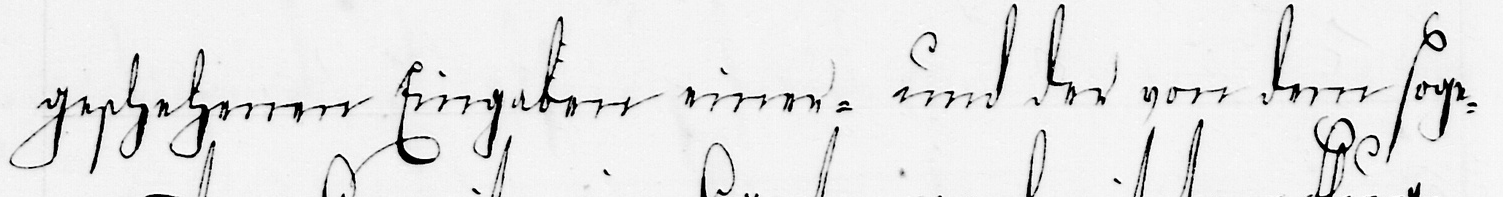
geschehenen Eingaben einer- und der von dem soge¬
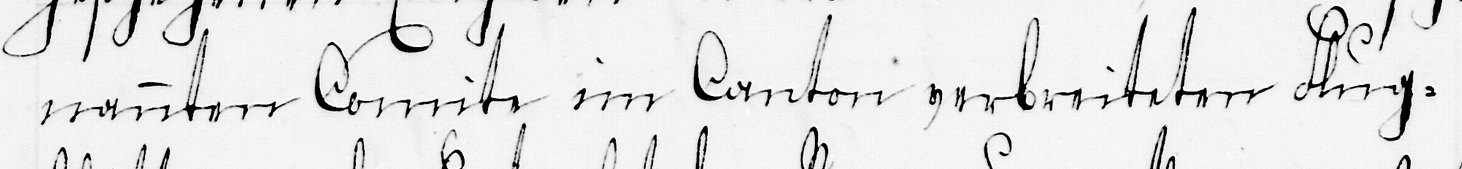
nannten Comite im Canton verbreiteten Flug¬
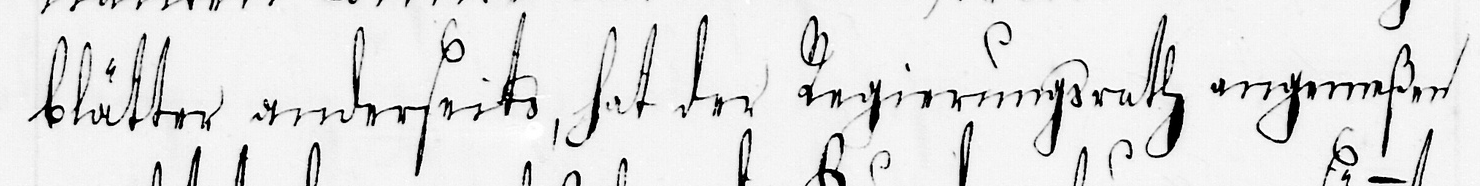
blätter anderseits, hat der Regierungsrath angemeßen
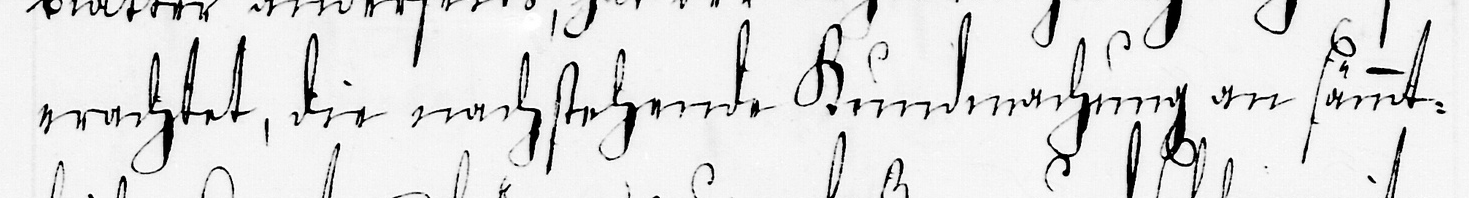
erachtet, die nachstehende Kundmachung an sämmt¬
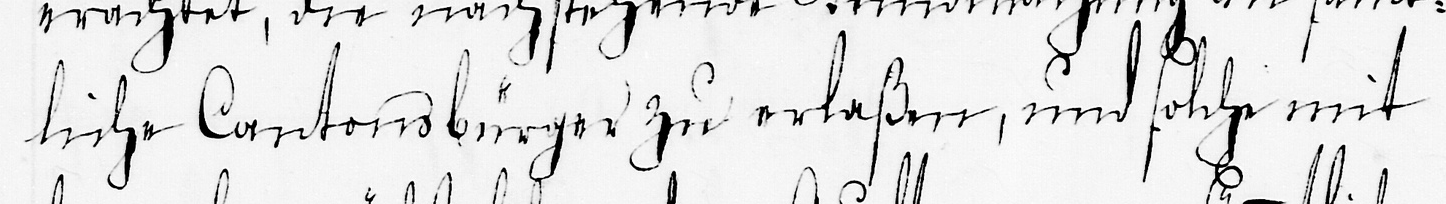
liche Cantonsbürger zu erlaßen, und solche mit
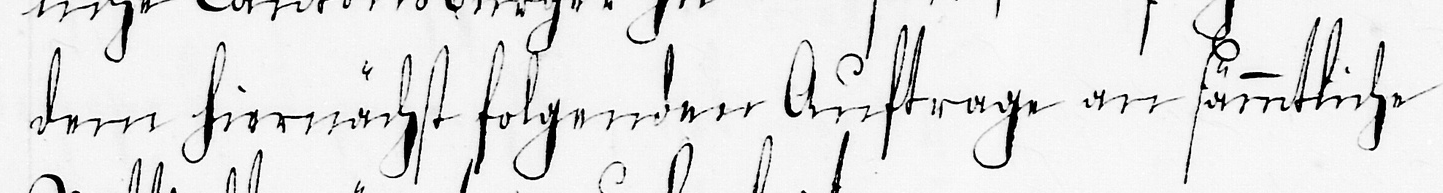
dem hiernächst folgenden Auftrage an sämmtliche
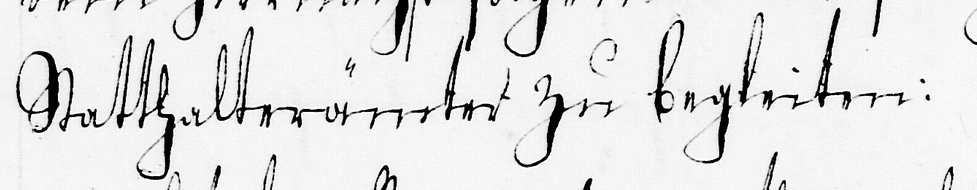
Statthalterämter zu begleiten:
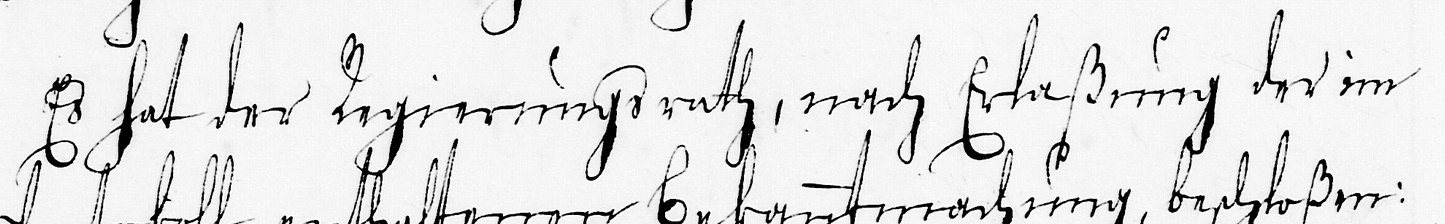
Es hat der Regierungsrath, nach Erlaßung der im
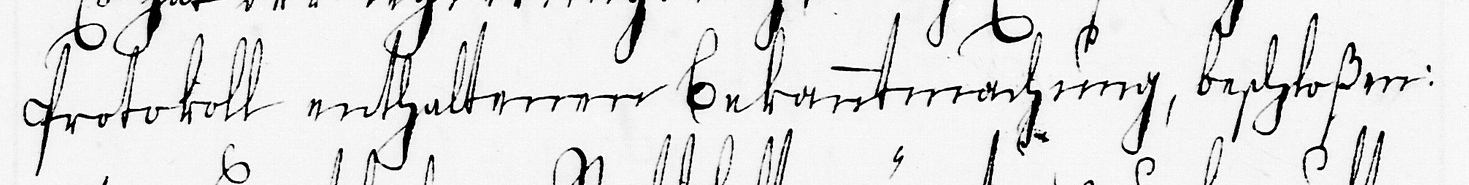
Protokoll enthaltenen Bekanntmachung, beschloßen:
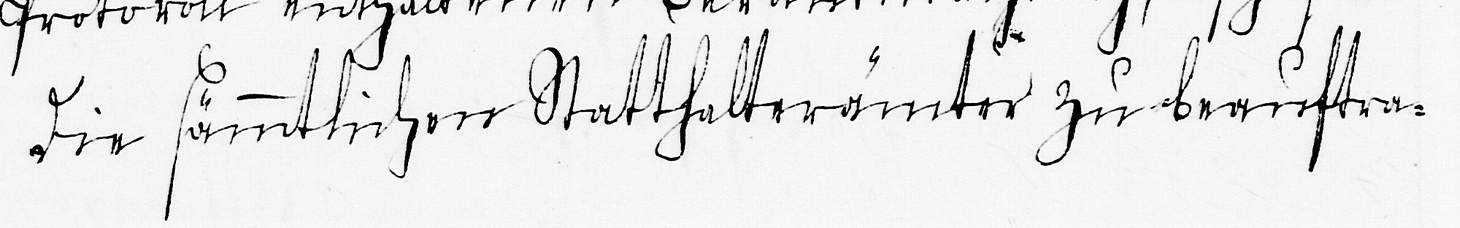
Die sämmtlichen Statthalterämter zu beauftra¬
